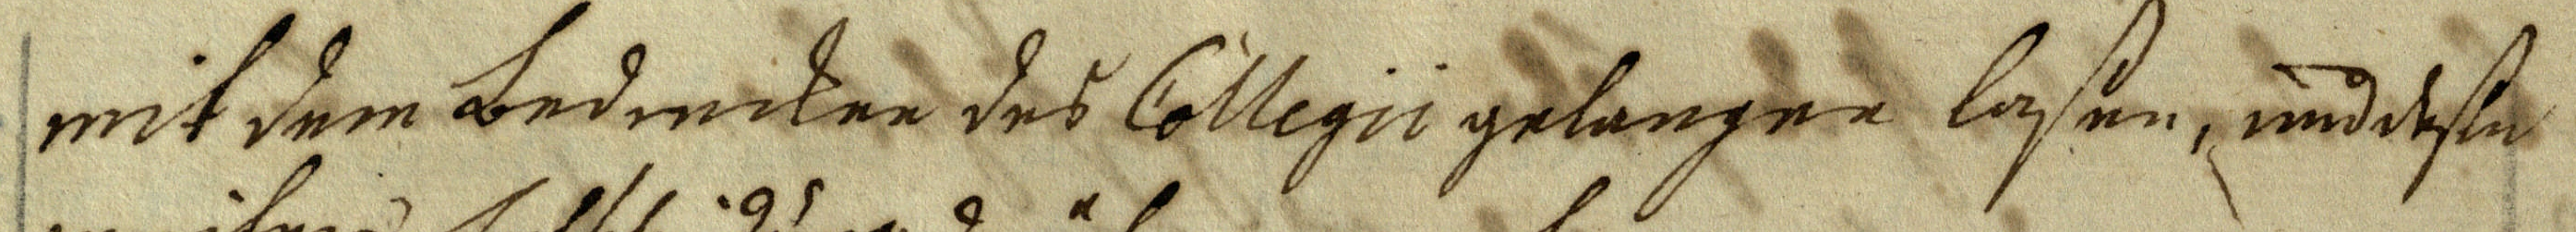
mit dem Bedenken des Collegii gelangen laßen, und deßen
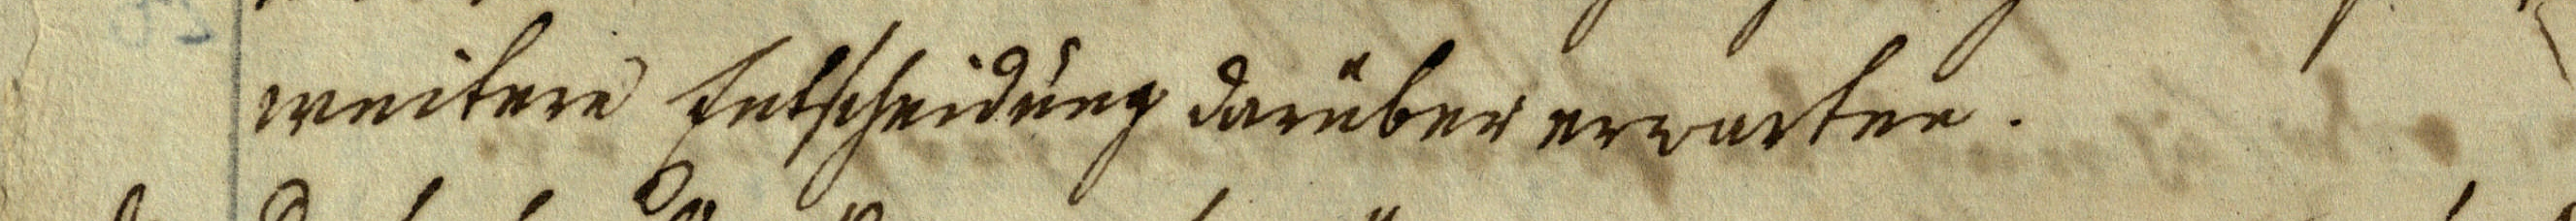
weitere Entscheidung darüber erwarten.
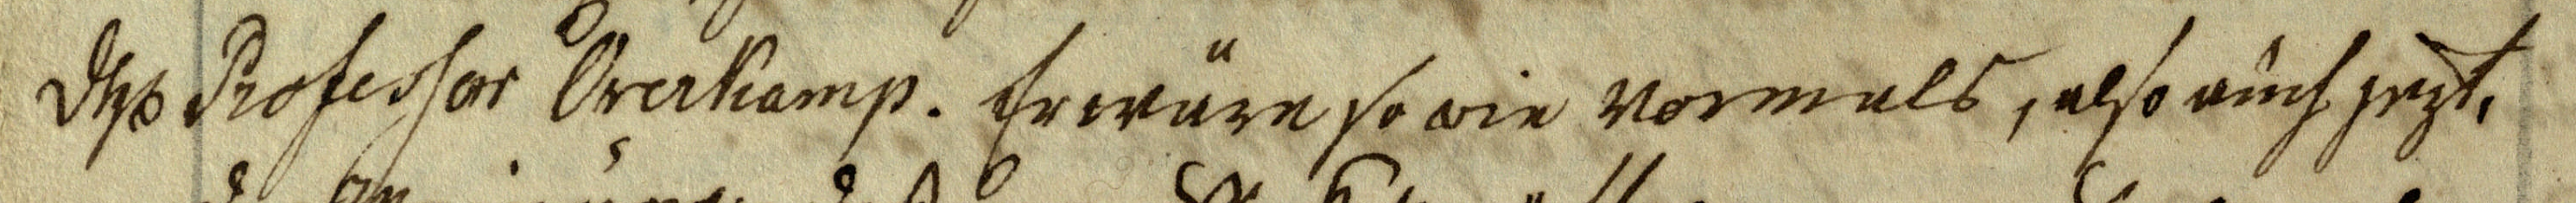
dh Professor Overkamp. Er wäre so wie vormals, also auch jezt,
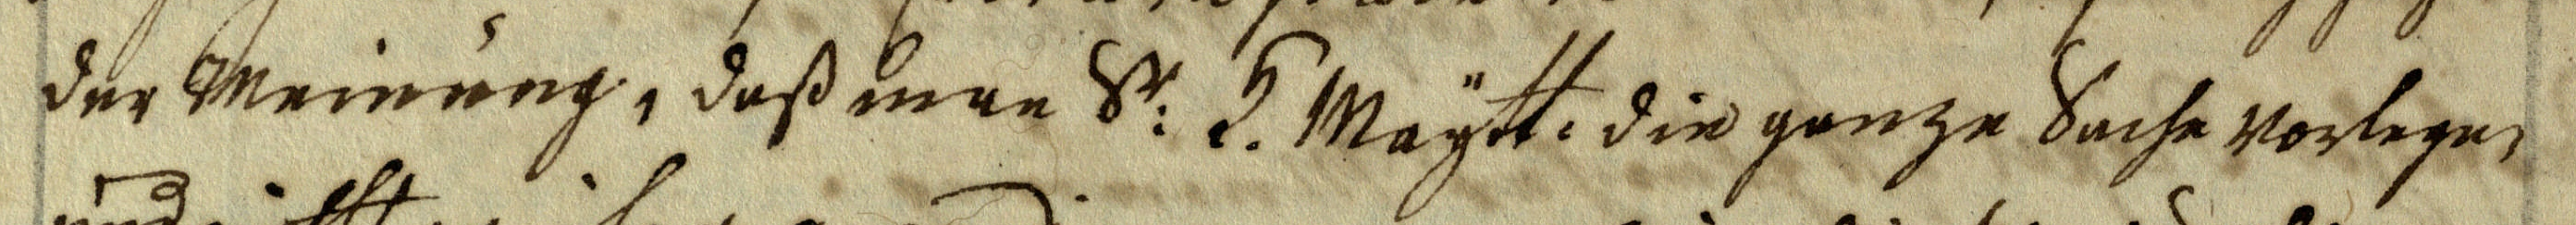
der Meinug, daß man S. K. Maÿtt. die ganze Sache vorlege,
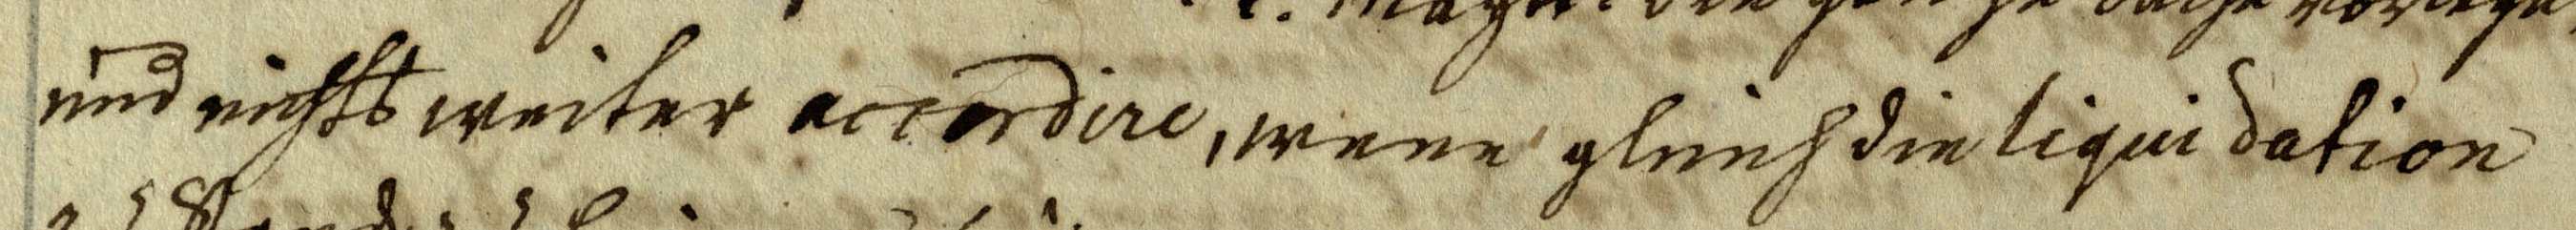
und nichts weiter accordire, wenn gleich die liquidation
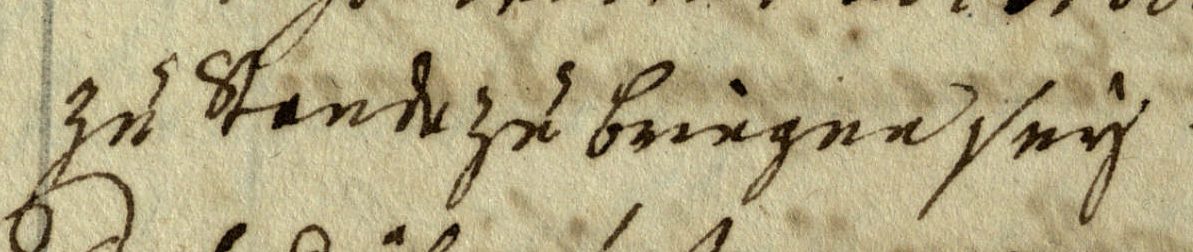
zu Stande zu bringen seÿ.
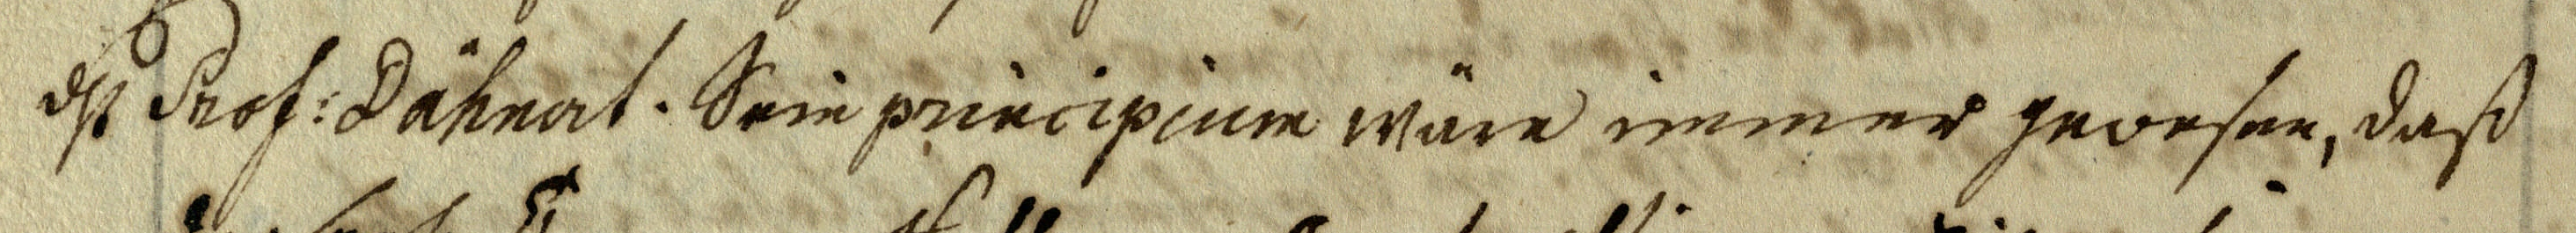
dh. Porf. Dähnert. Sein principium wäre immer gewesen, daß
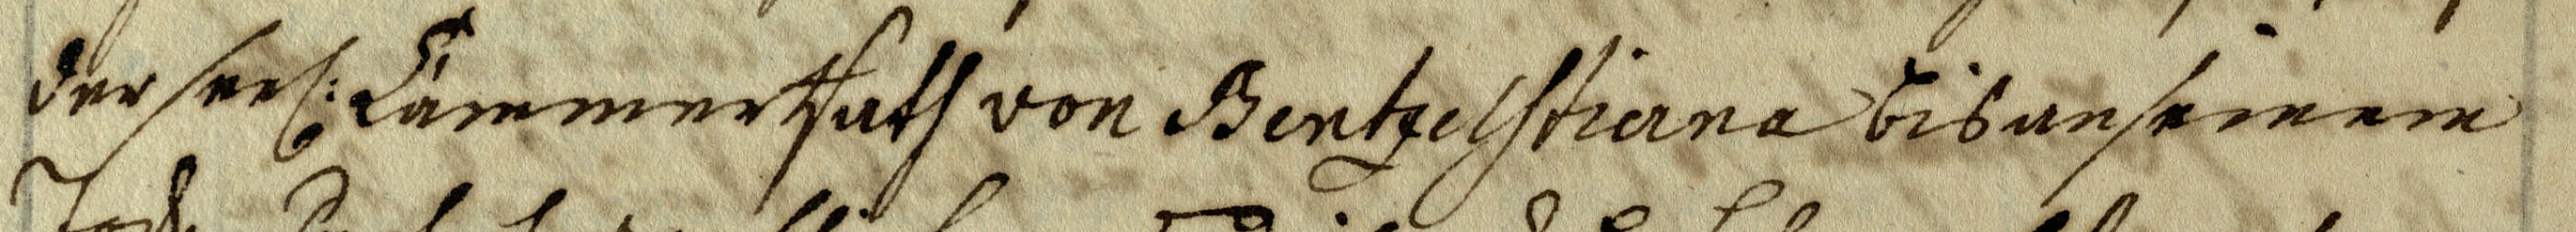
der seel. CammerRath von Bentzelstierna bis an seinem
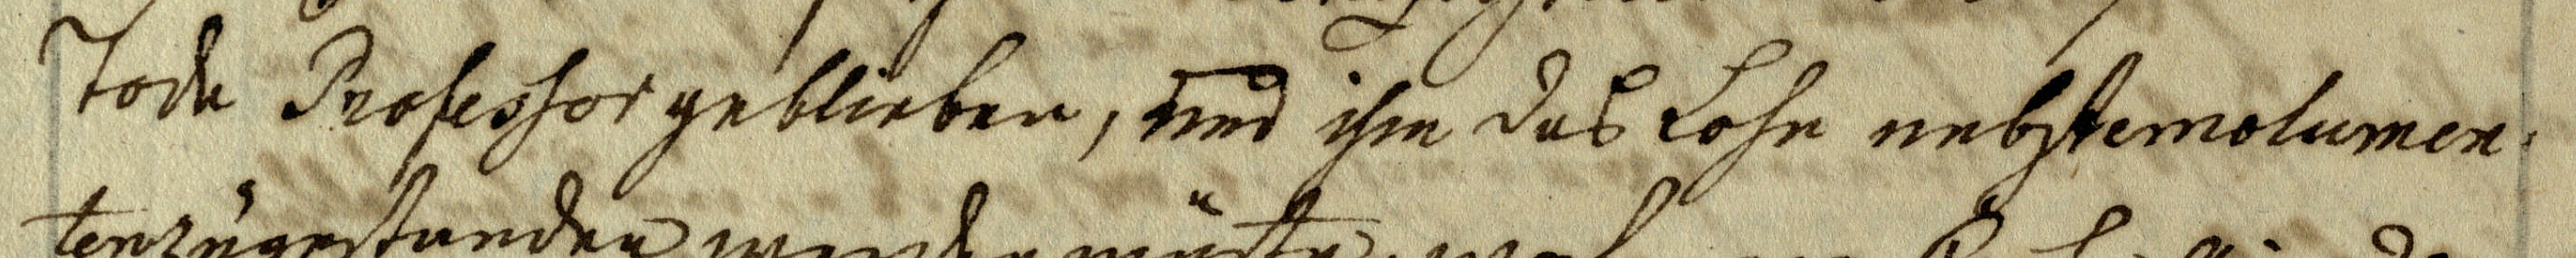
Tode Professor geblieben, und ihm das Lohn nebst emolumen¬
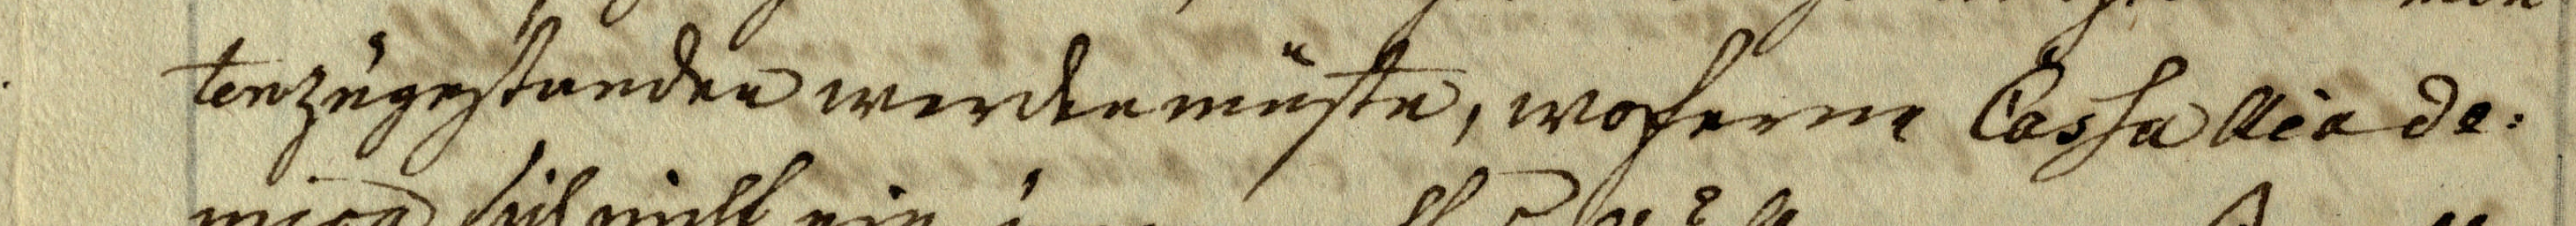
ten zugestanden werden müßte, woferne Cassa Acade¬
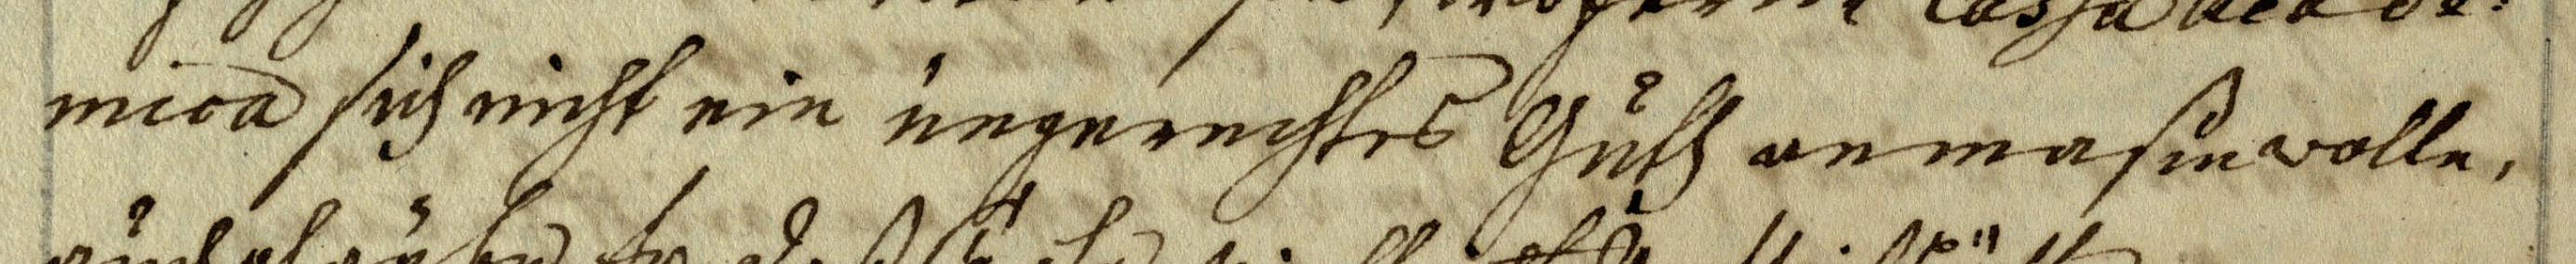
mica sich nicht ein ungerechtes Guth anmaßen wolle,
